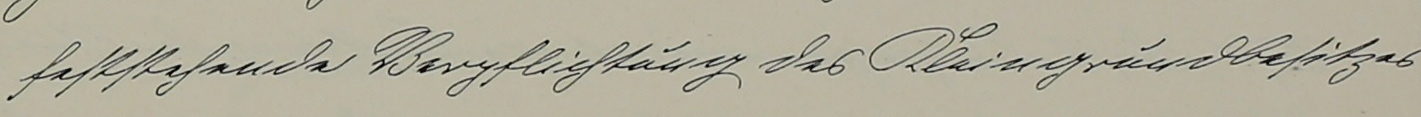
feststehende Verpflichtung des Kleingrundbesitzes
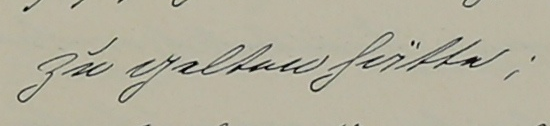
zu gelten hätte;
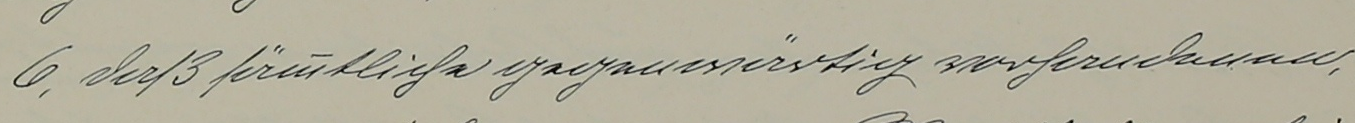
6. daß sämmtliche gegenwärtig vorhandenen,
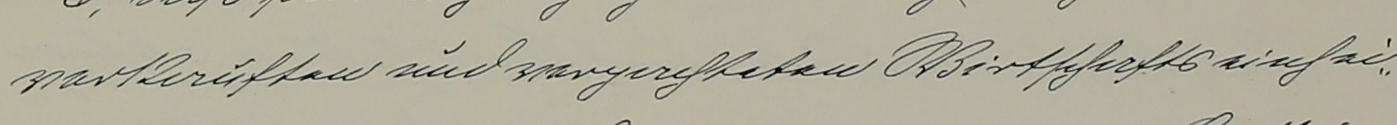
verkauften und verpachteten Wirtschaftseinhei-
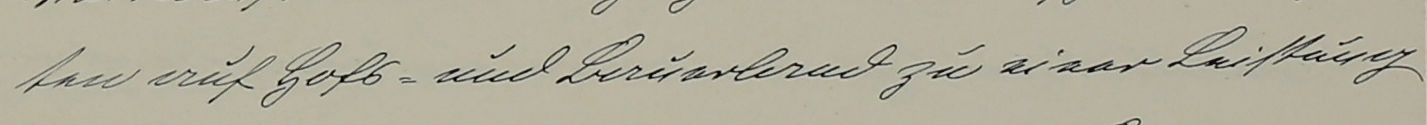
ten auf Hofs- und Bauerland zu einer Leistung
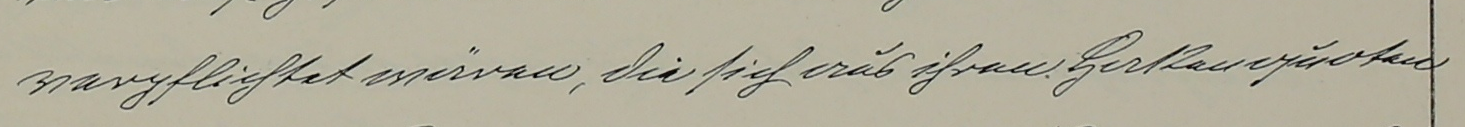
verpflichtet wären, die sich aus ihren Hakenquoten
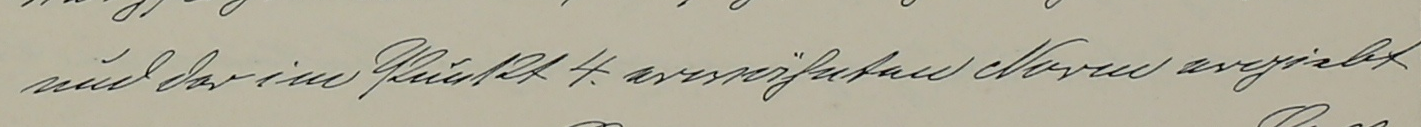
und der im Punkt 4. erwähnten Norm ergiebt
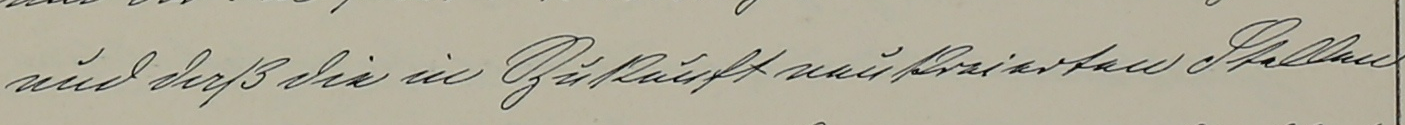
und daß die in Zukunft neukreierten Stellen
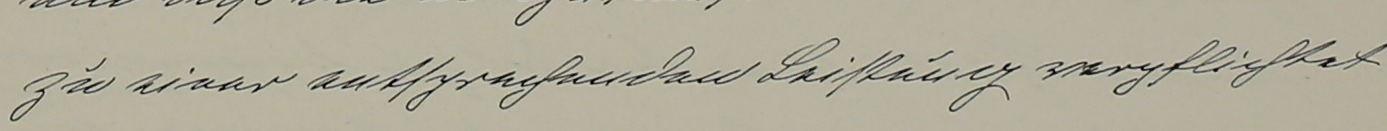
zu einer entsprechenden Leistung verpflichtet
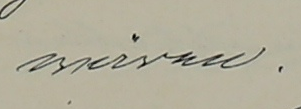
wären.
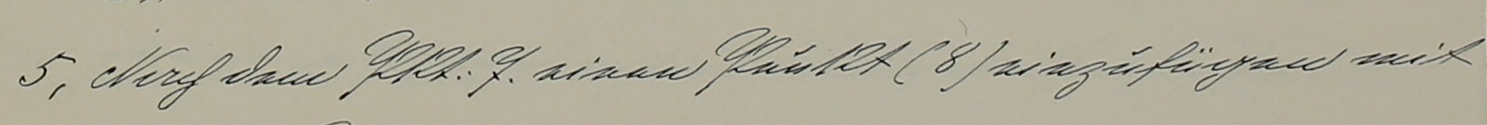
5. Nach dem Pkt. 7. einen Punkt (8) einzufügen mit
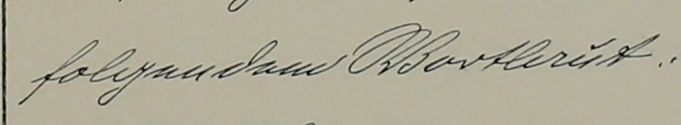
folgendem Wortlaut:
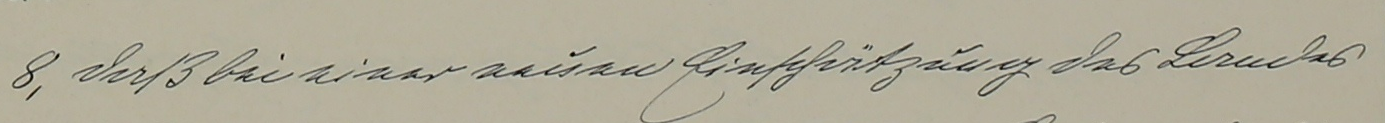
8. daß bei einer neuen Einschätzung des Landes
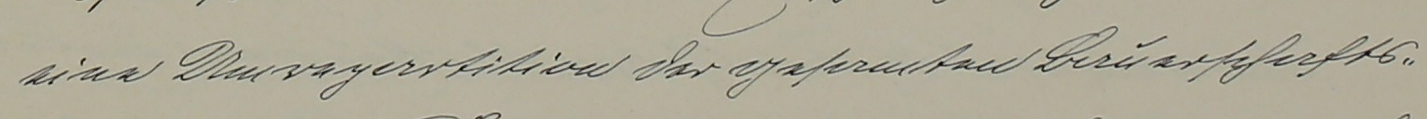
eine Umrepartition der gesamten Bauerschafts-
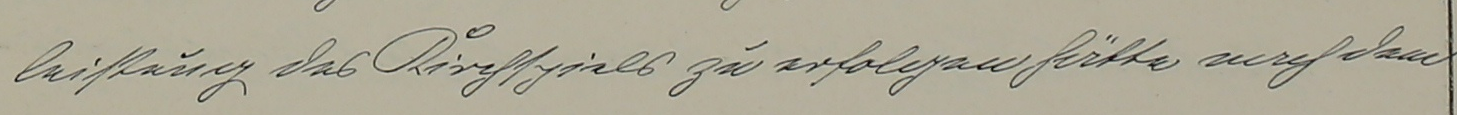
leistung des Kirchspiels zu erfolgen hätte nach dem
